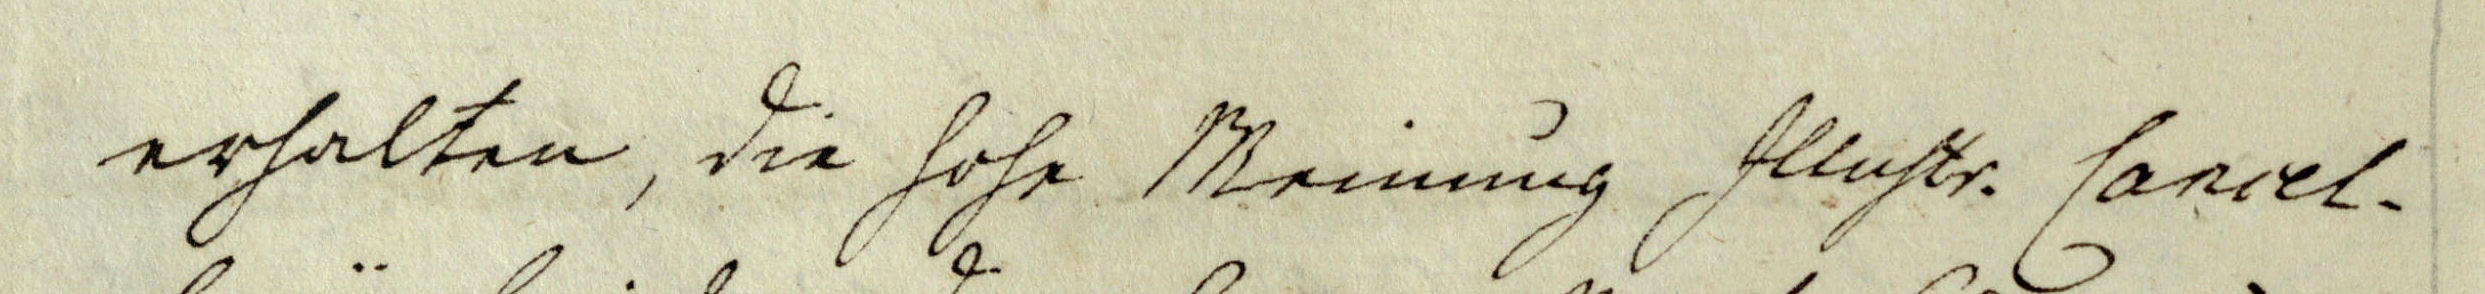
erhalten, die hohe Meinung Illustr. Cancel¬
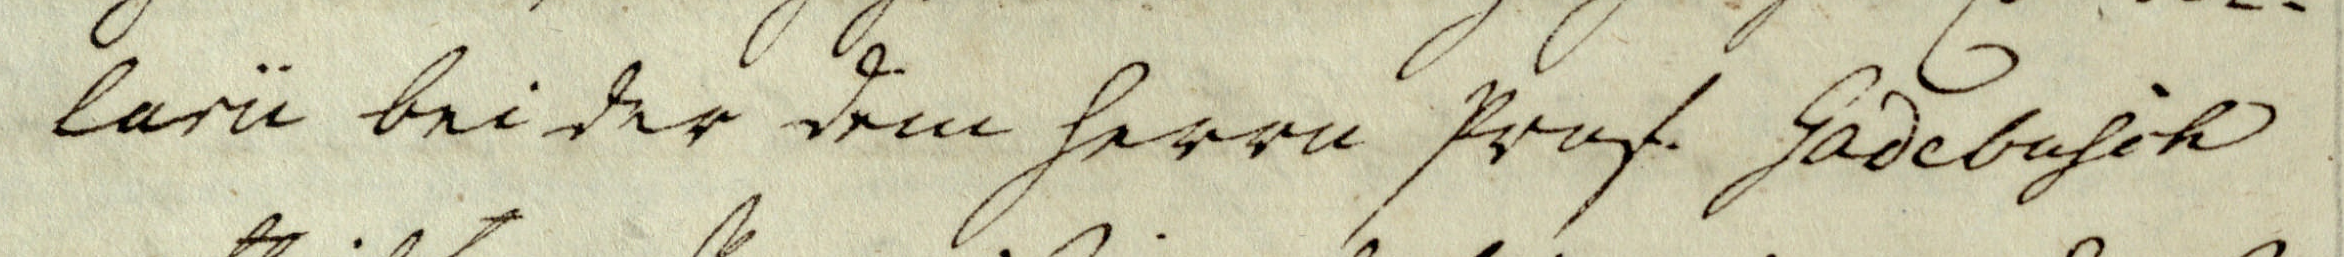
larii bei der dem Herrn Prof. Gadebusch
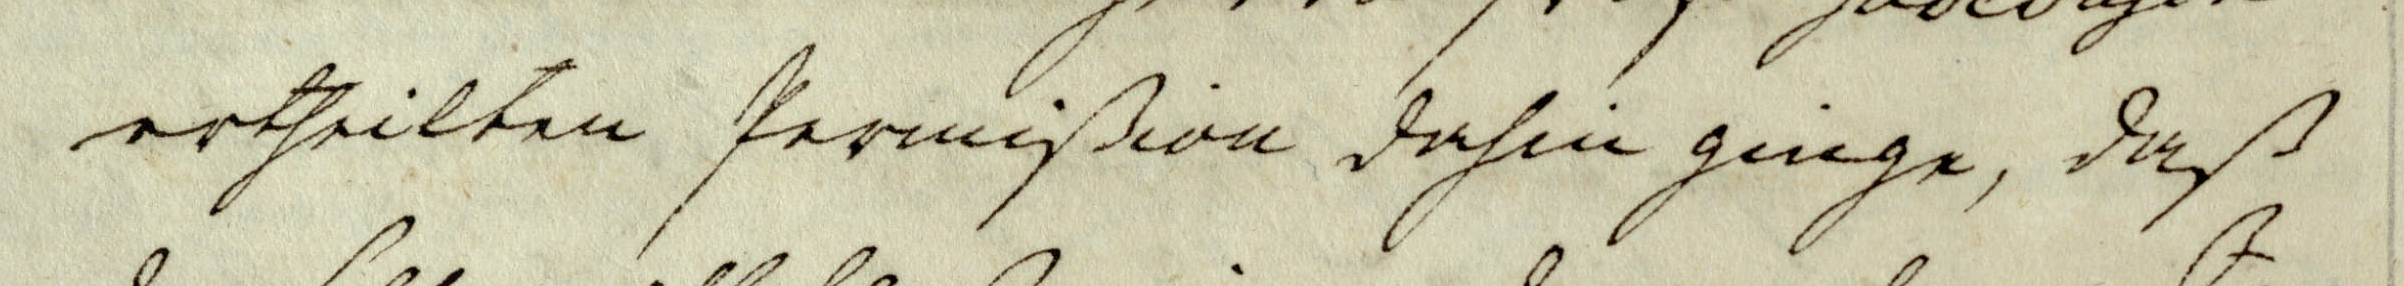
ertheilten Permission dahin ginge, daß
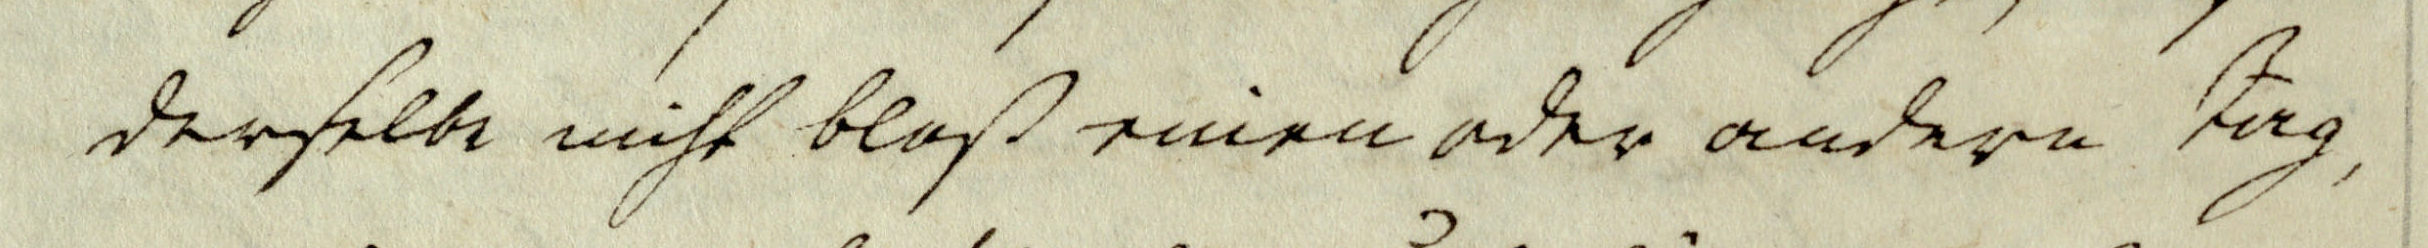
derselbe nicht bloß einen oder andern Tag,
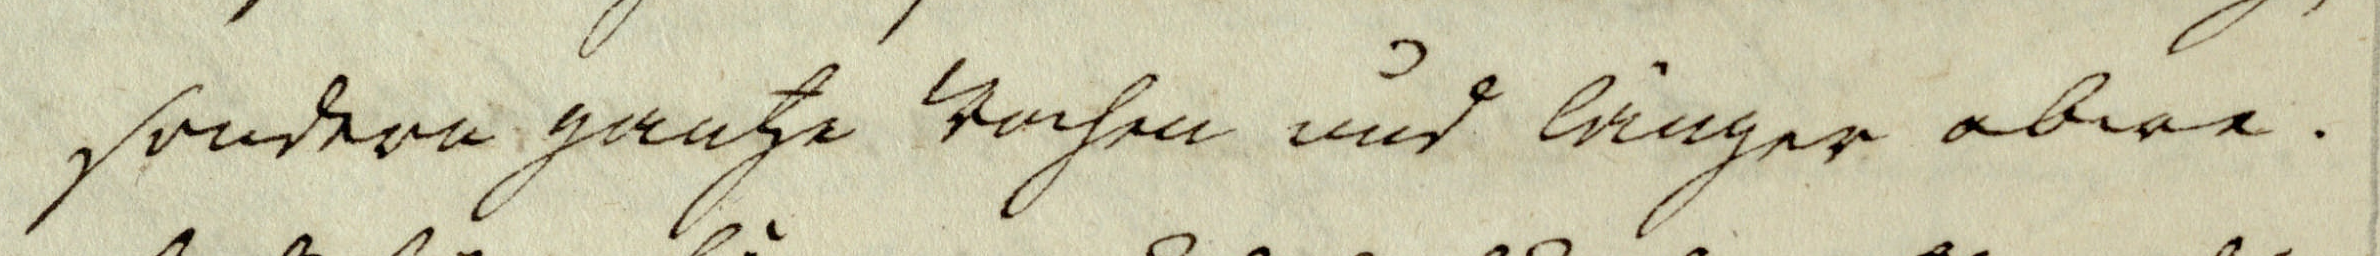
sondern gantze Wochen und länger abwe¬
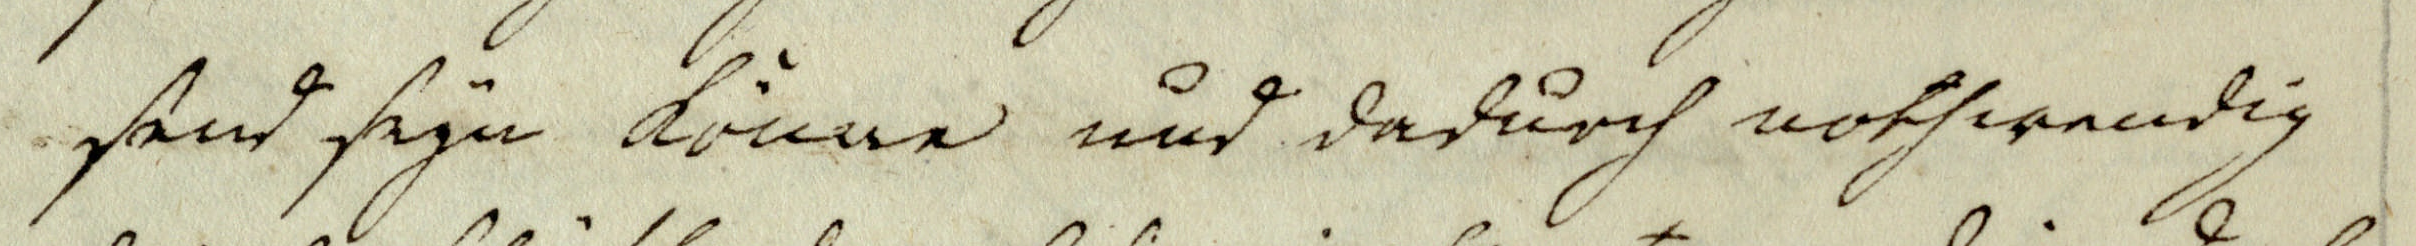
send seÿn könne und dadurch nothwendig
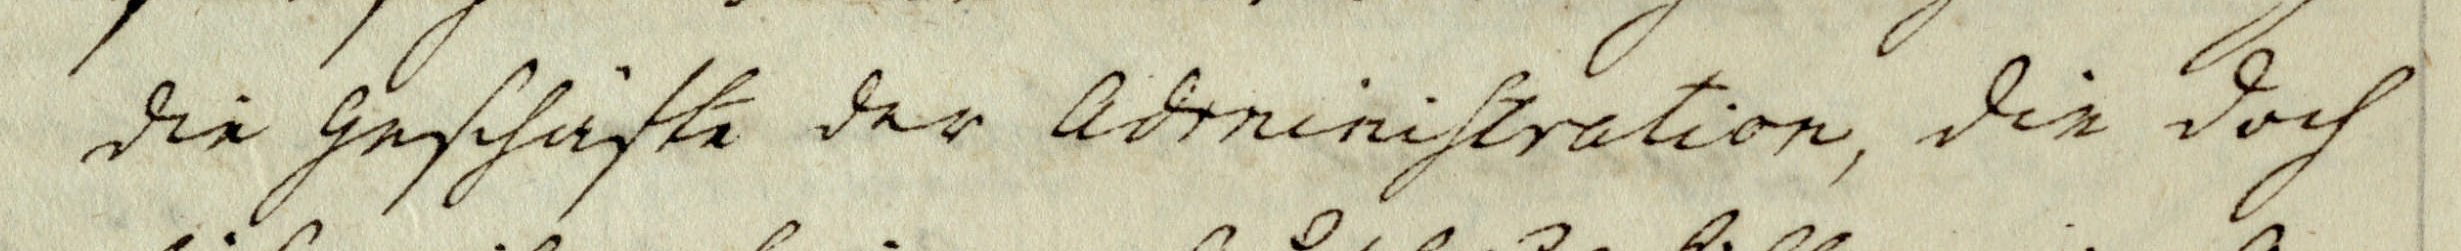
die Geschäfte der Administration, die doch
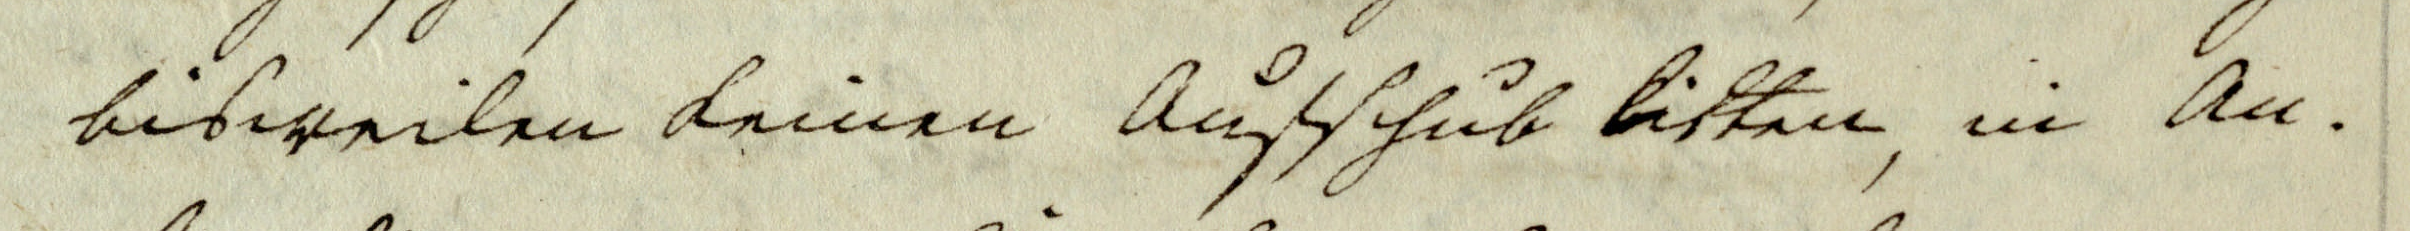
bisweilen keinen Aufschub litten, in An¬
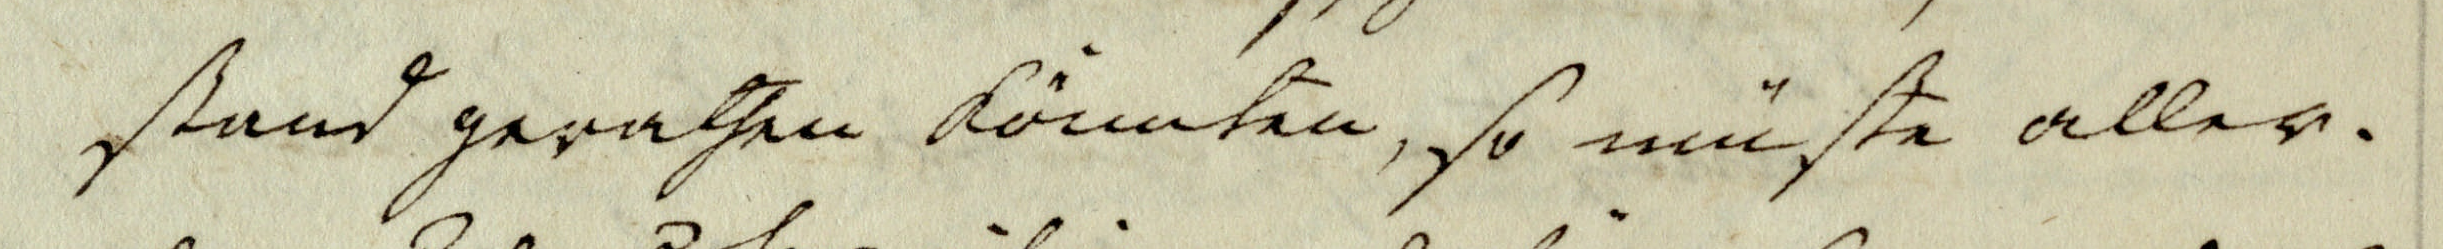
stand gerathen könnten, so müßte aller¬
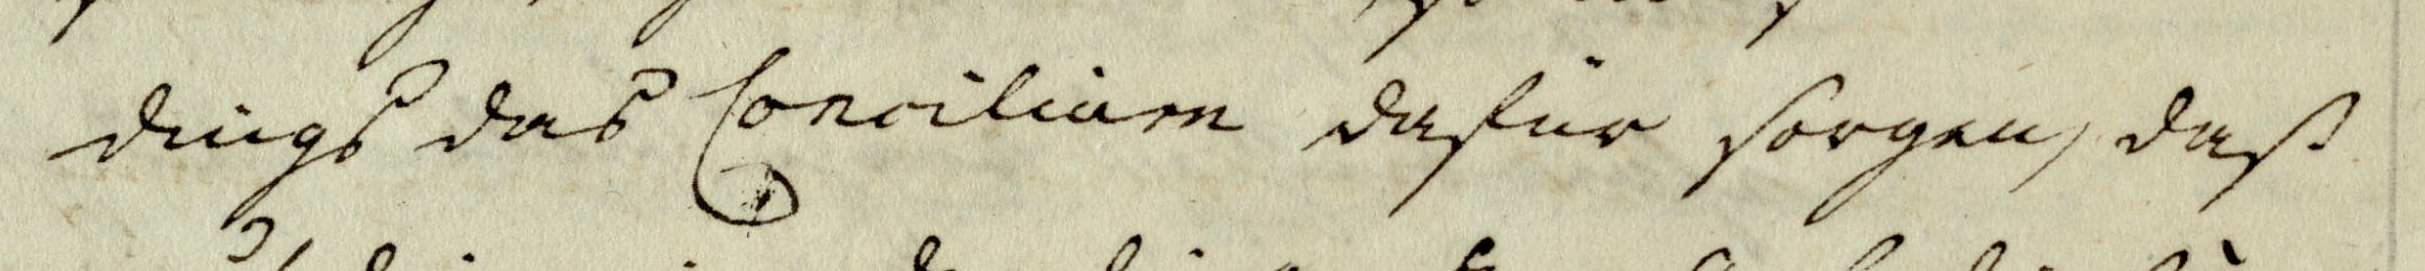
dings das Concilium dafür sorgen, daß
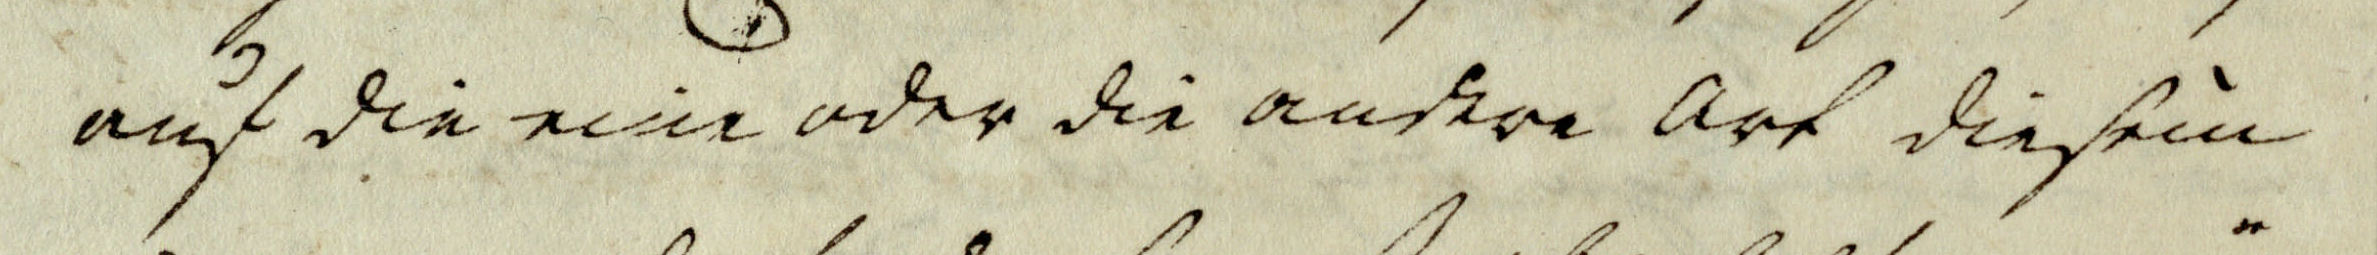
auf die eine der die andere Art diesem
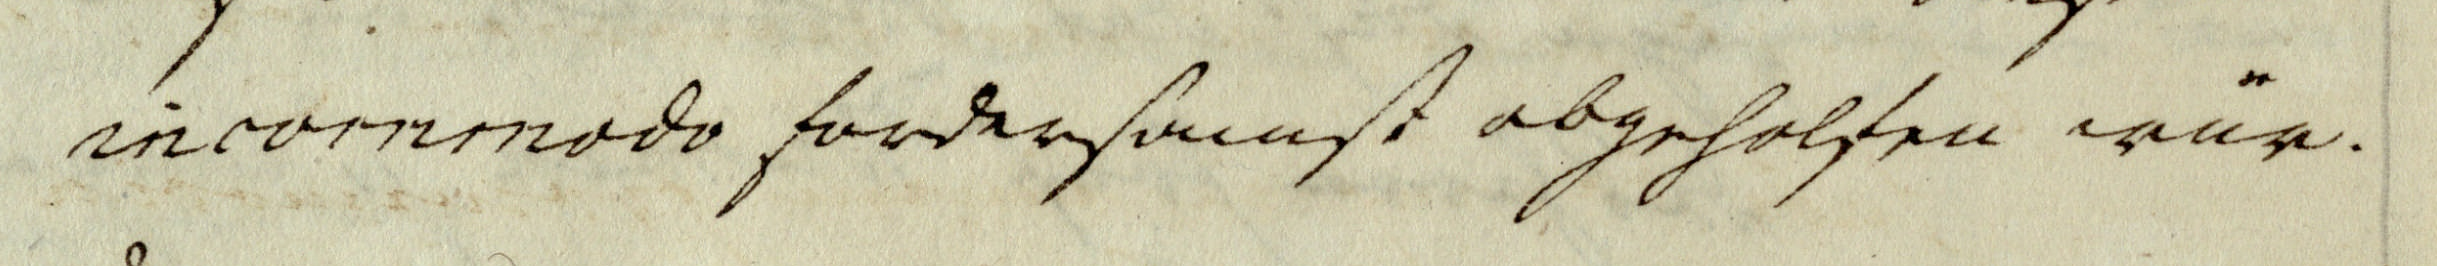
incommodo fordersamst abgeholfen wür¬
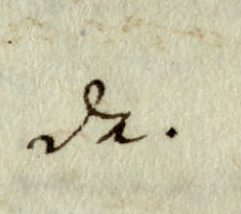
de.
